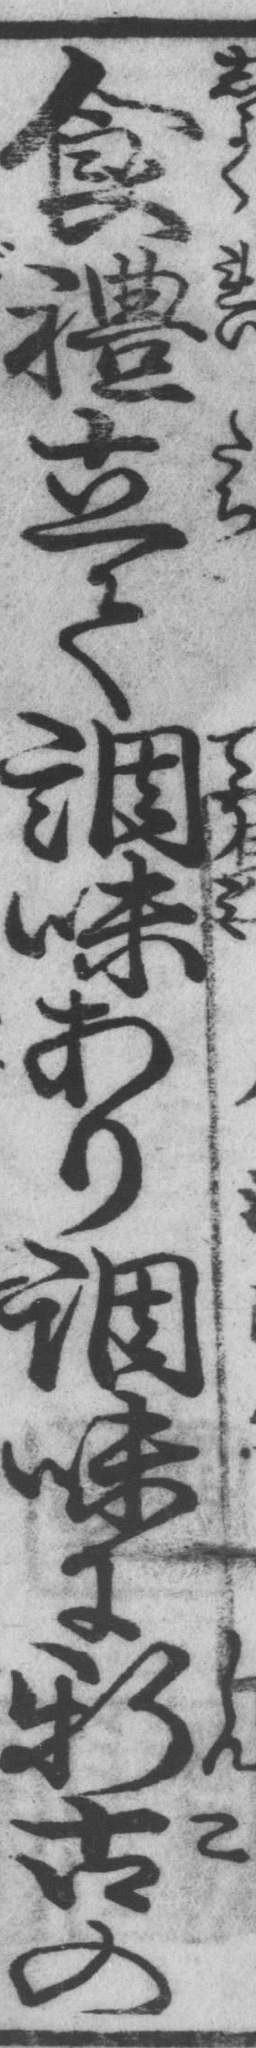食禮立て調味あり調味尓新古の
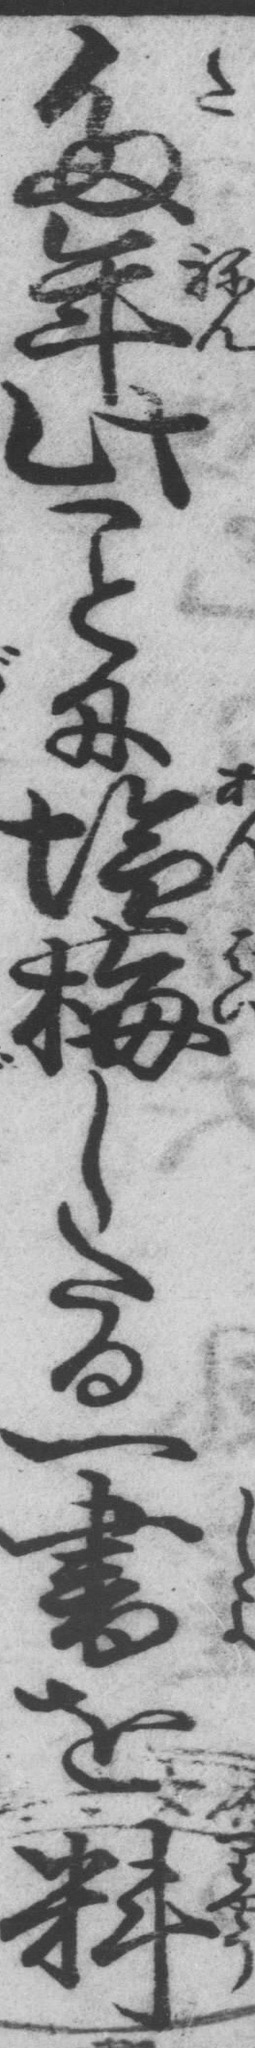多年此こと丹塩梅したる書を料
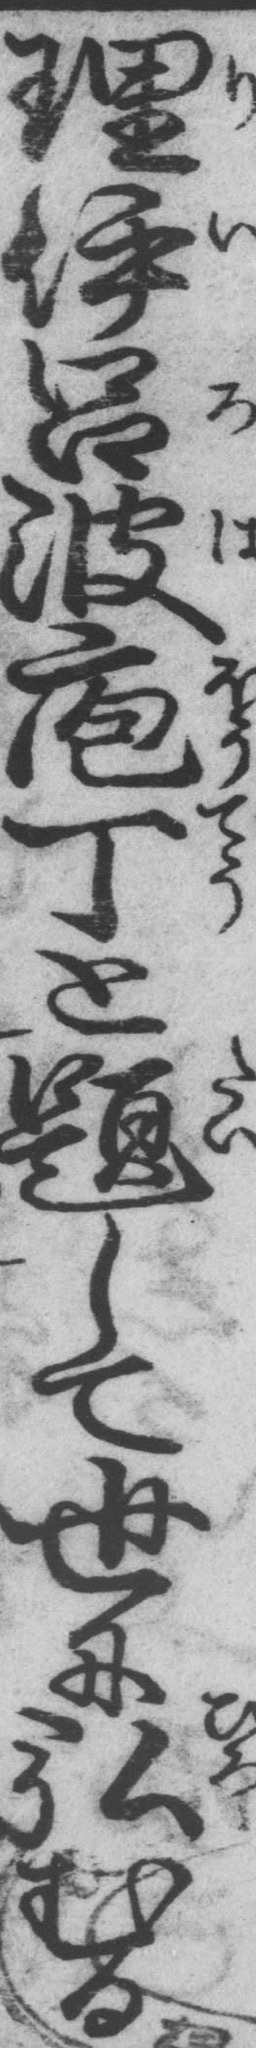理伊呂波庖丁と題して世丹弘むる
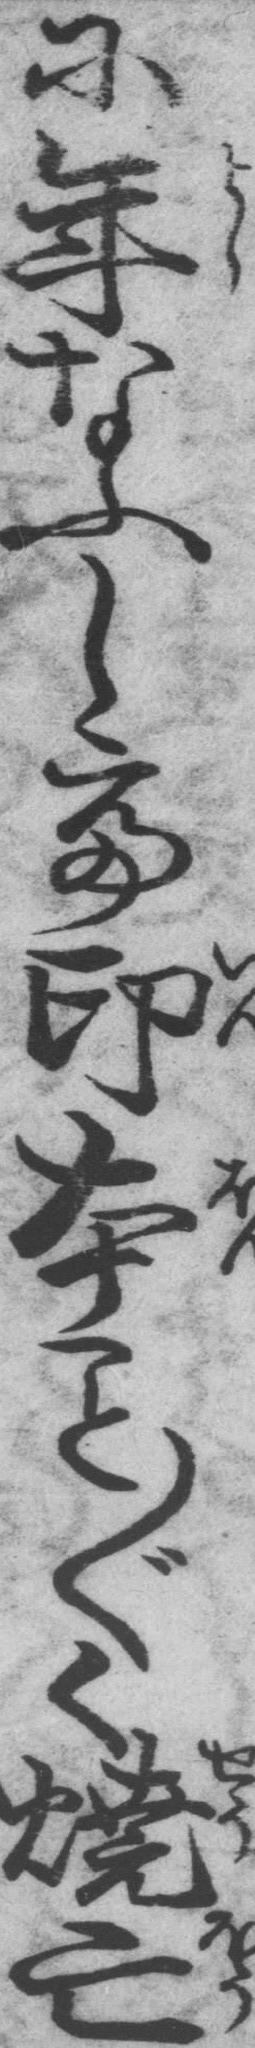尓年なふし亭印本こと〴〵く焼亡
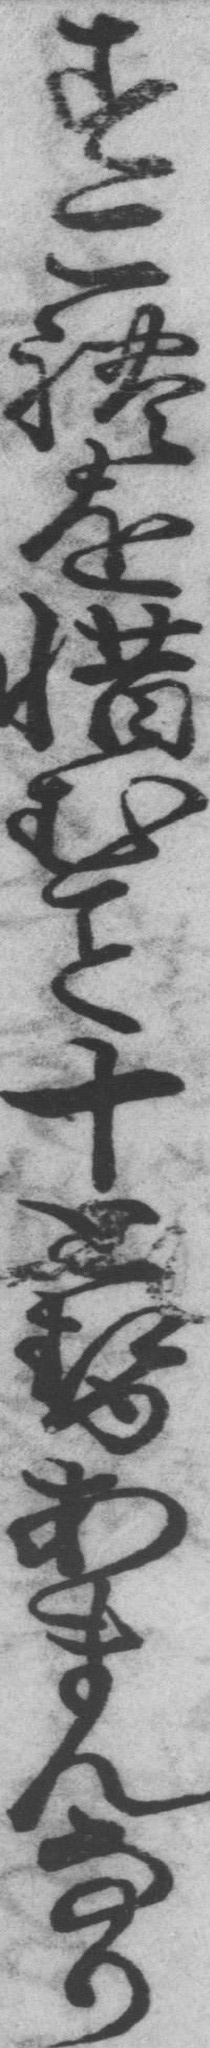春二禮を惜むこと十とあまんなり

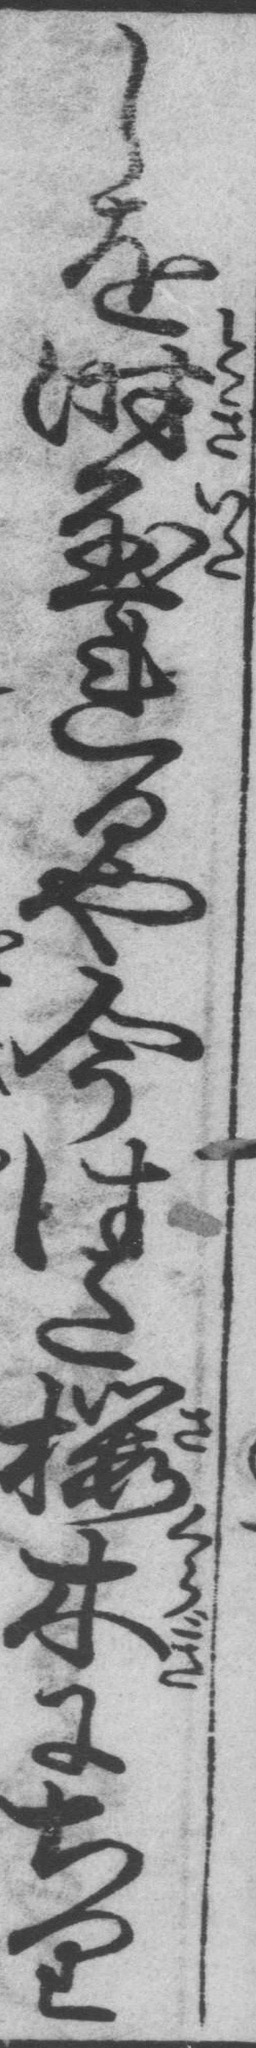しを時至連るや今津た桜木尓ち里
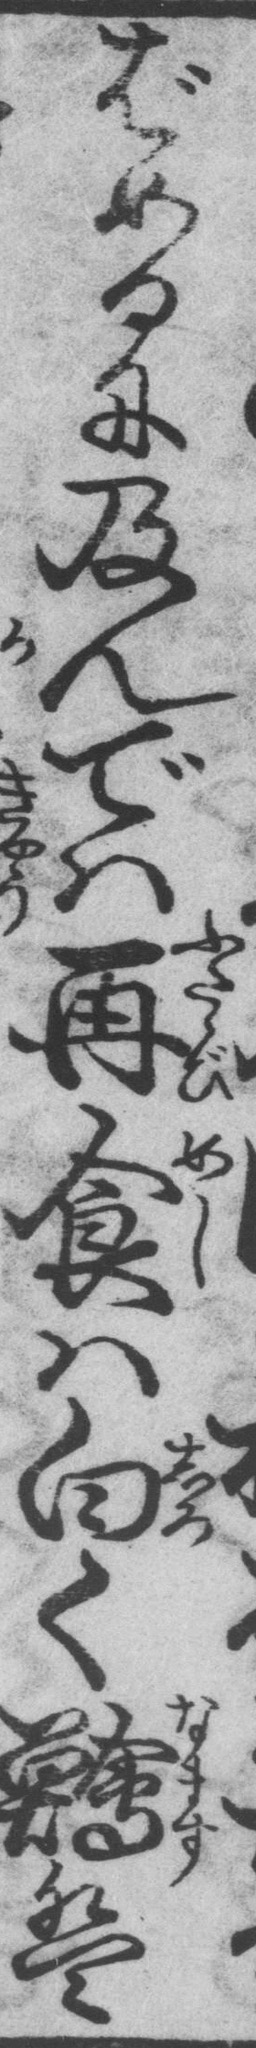ばめる丹及んでは再食は白く鯰盤
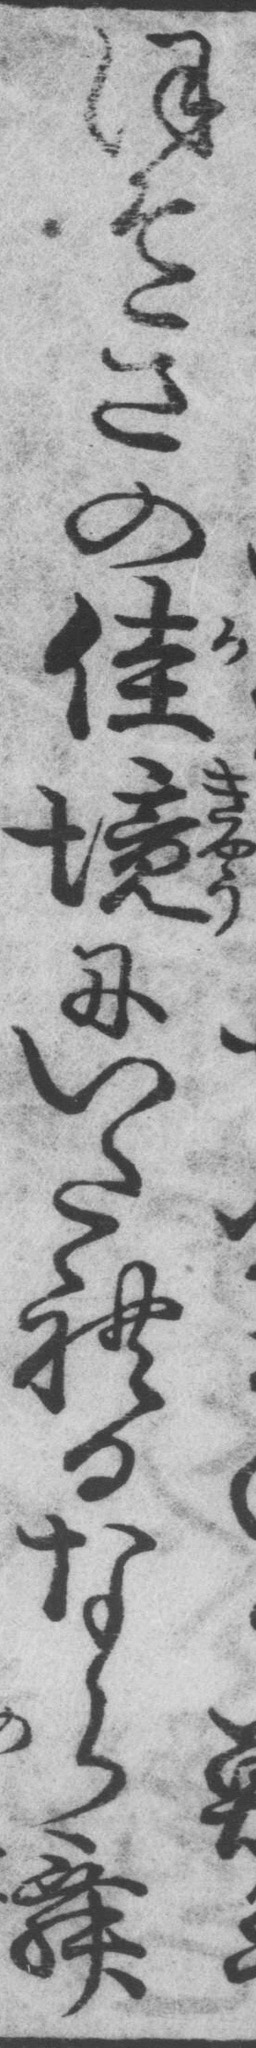ほそきの佳境丹いた禮るなら舞
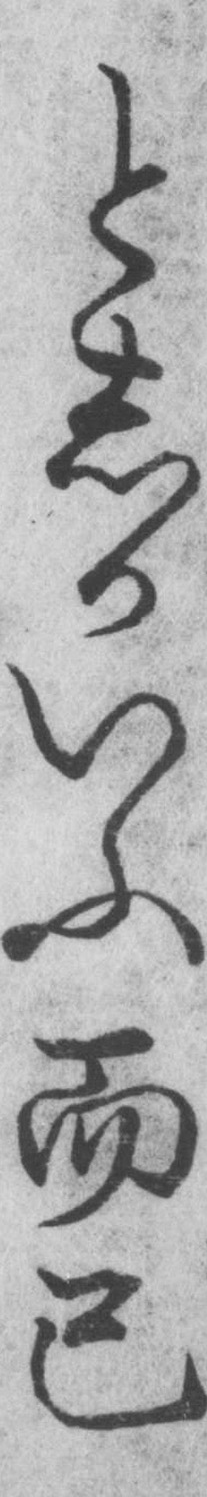と志かいふ而巳
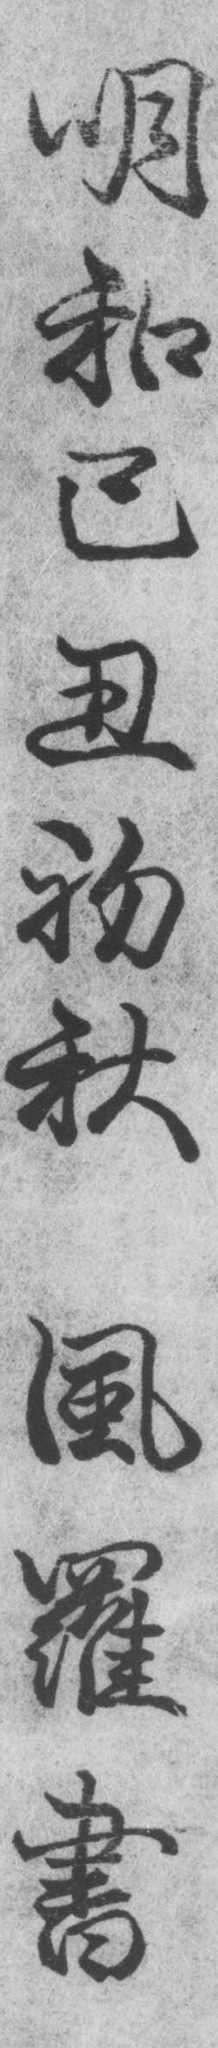明和巳丑初秋風羅書
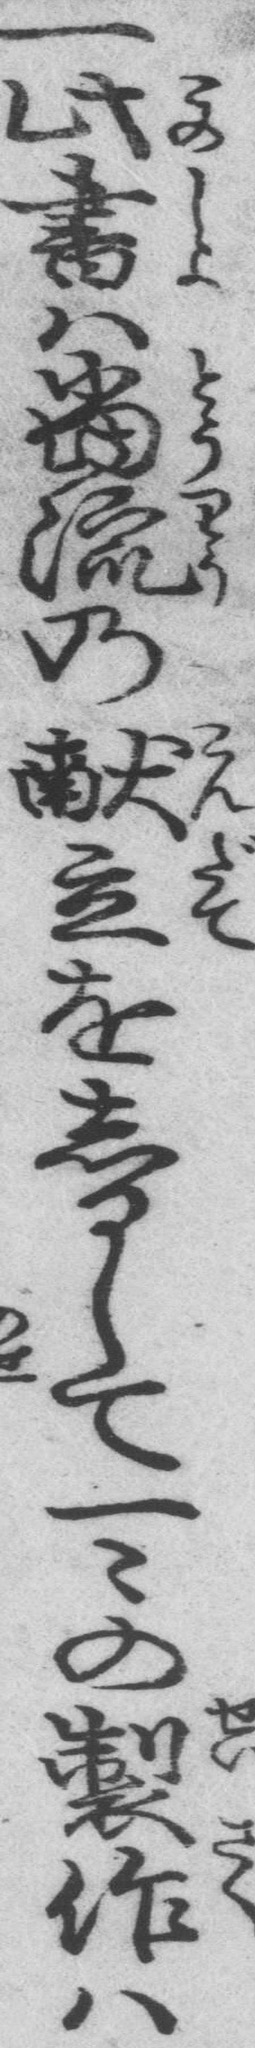一此書は當流乃献立を志るして一々の製作は
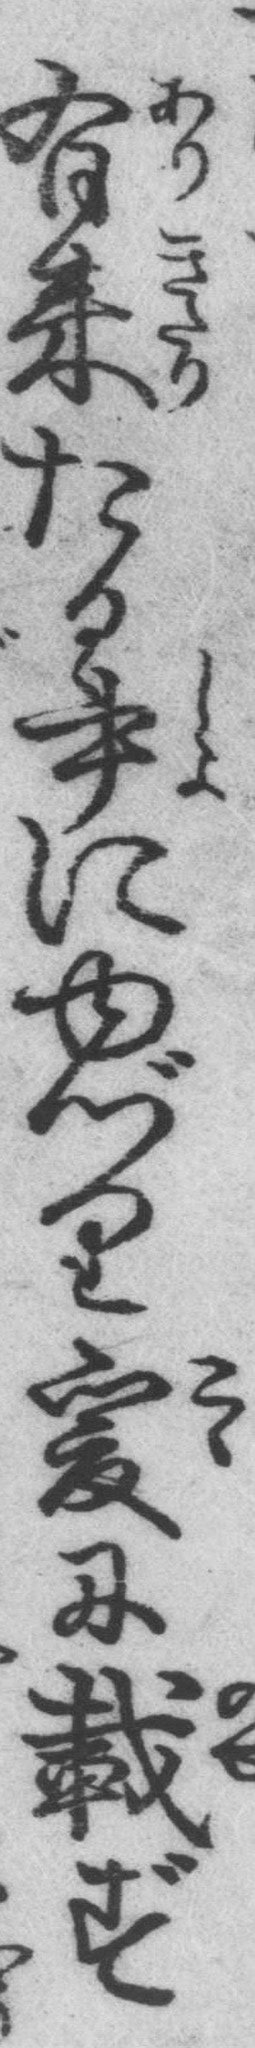有来たる書にゆづ里爰丹載ず
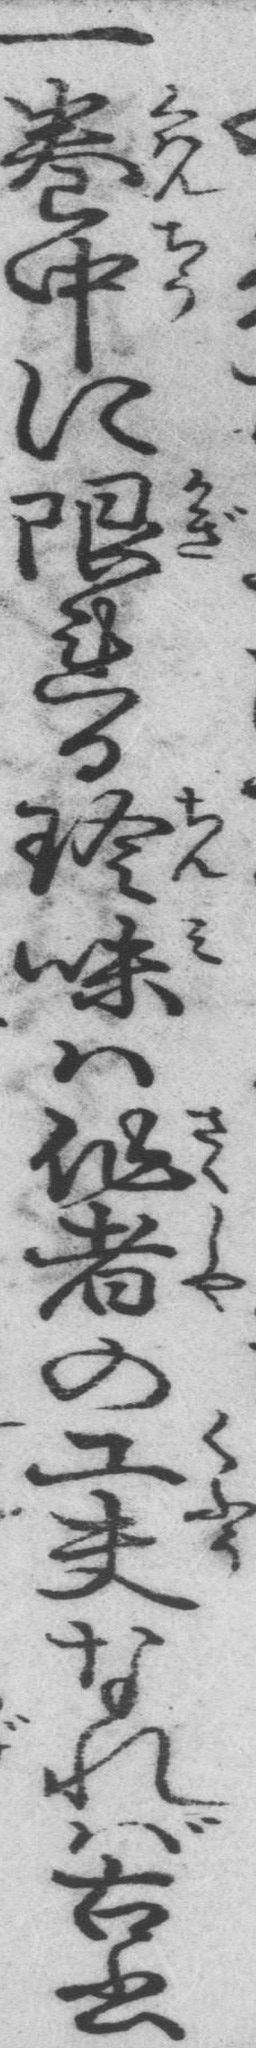一巻中に限連る珍味は作者の工夫なれば古出
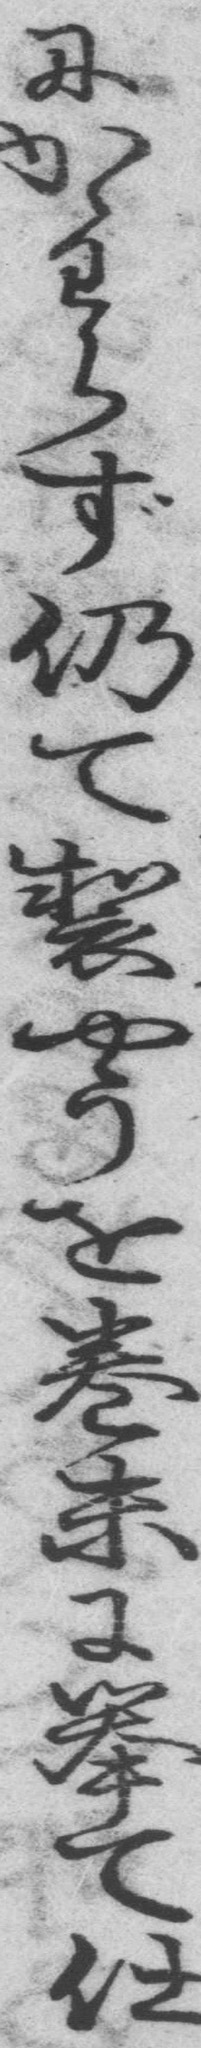丹かゝわらず仍て製やうを巻末尓挙て仕
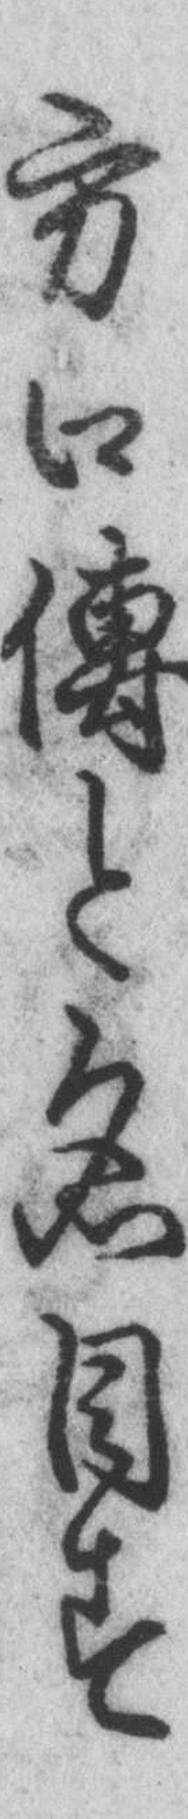方口傳と名目春
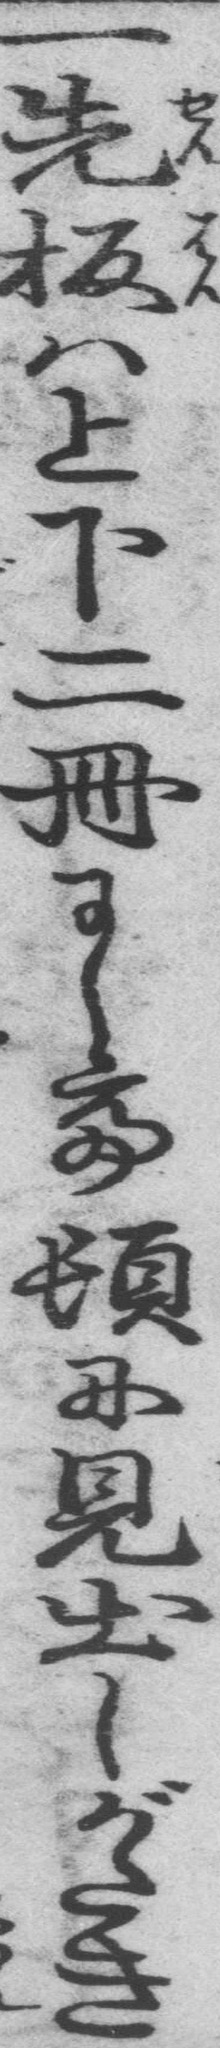一先板は上下二冊尓し亭頓丹見出しがたき
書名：料理伊呂波庖丁
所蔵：大阪府立大学学術情報センター 国文学研究資料館
